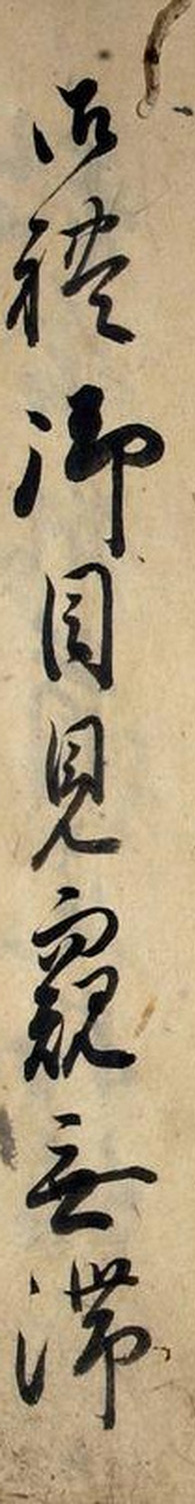御礼御目見窺無滞

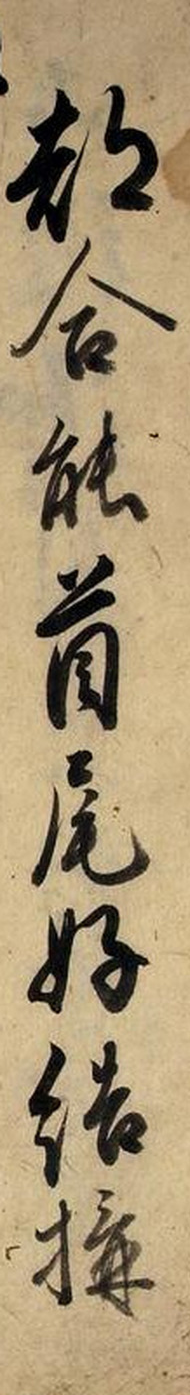都合能首尾好結構
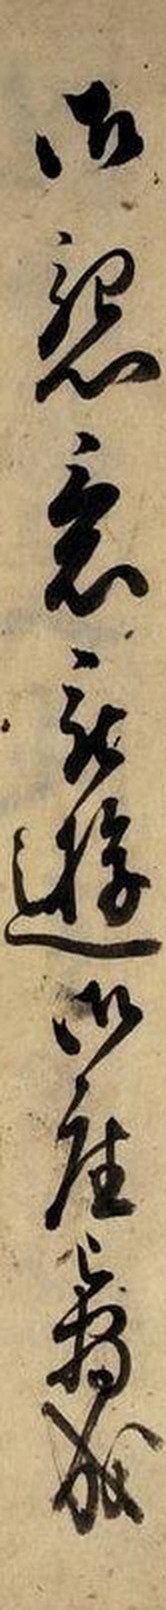御懇意被遊御座被為成
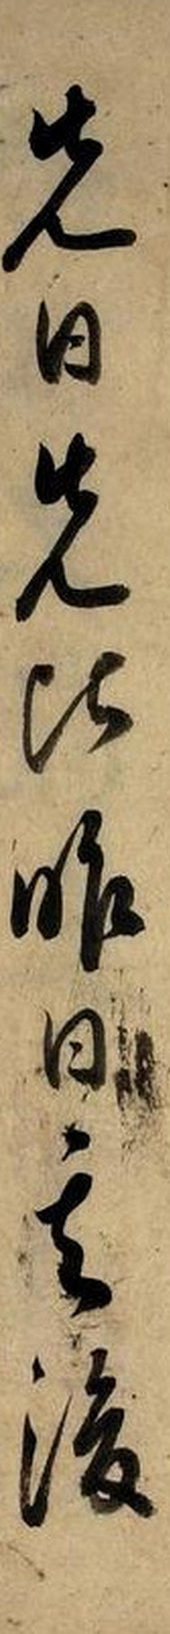先日先頃昨日其後
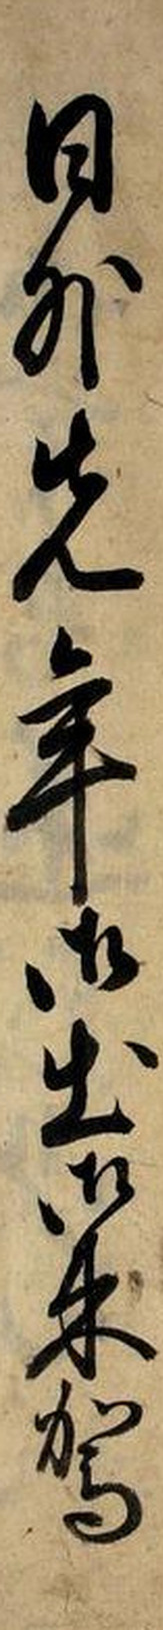日外先年御出御来駕
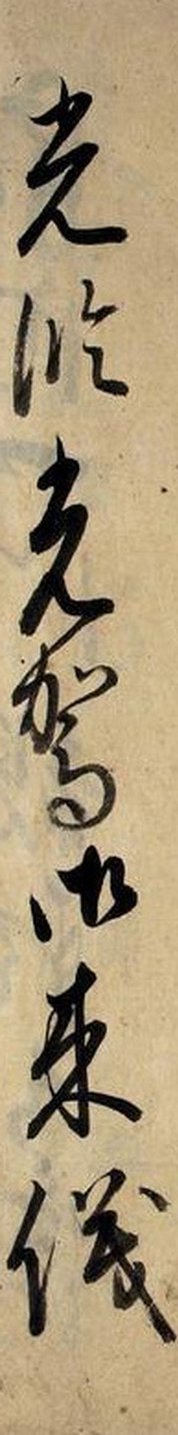光臨光駕御来儀
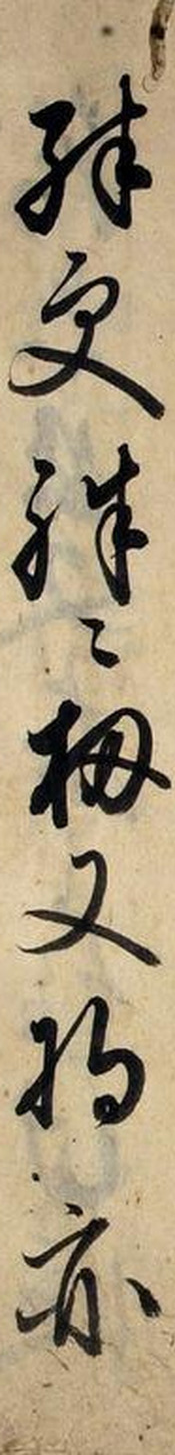殊更殊ニ扠又将亦

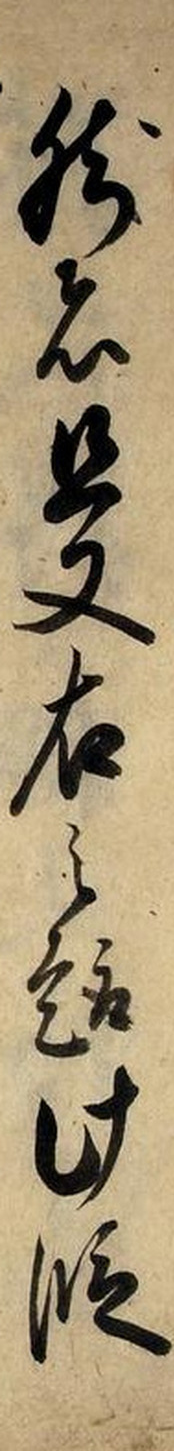然者且又右之趣此段
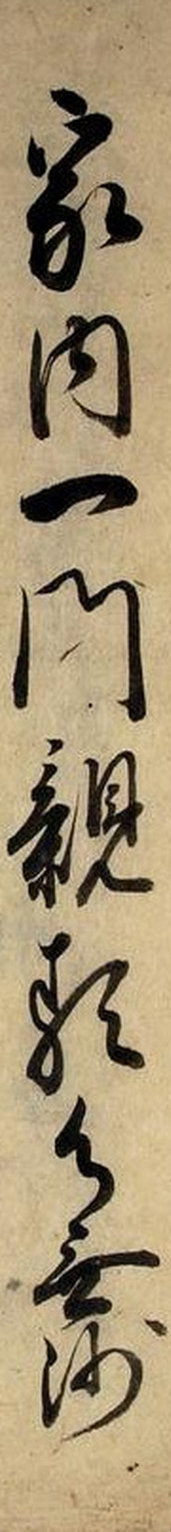家内一門親類御無沙
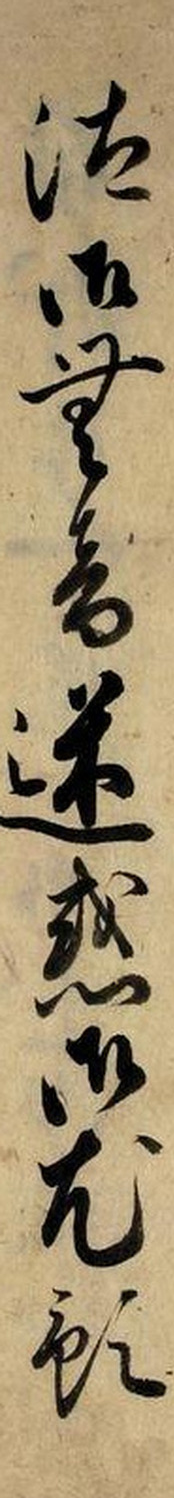汰御無音迷惑御尤預
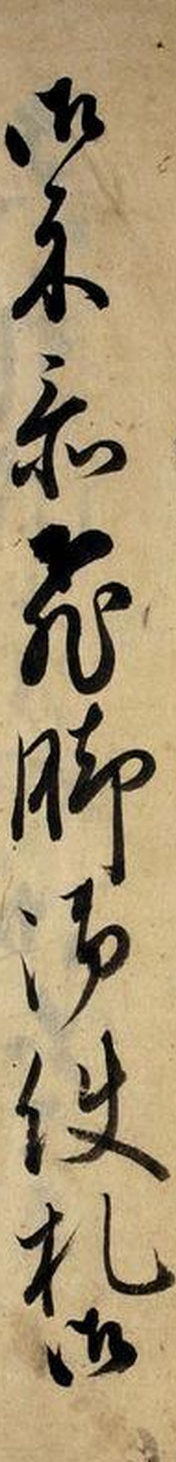御示忝飛脚御使札御
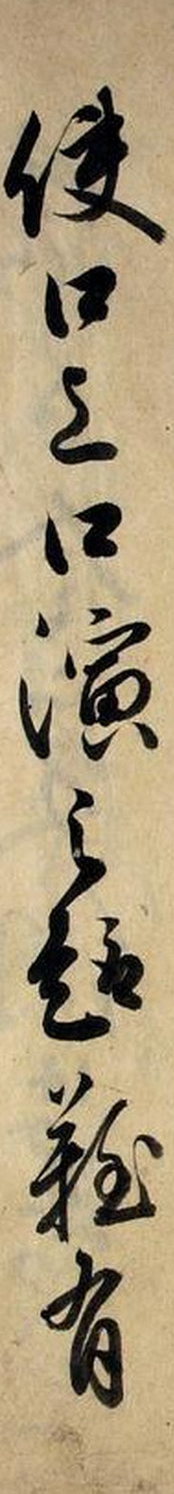使口上口演之趣難有
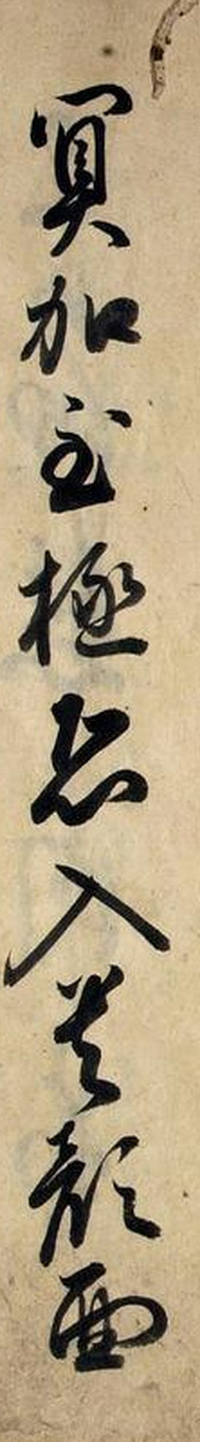冥加至極恐入貴顔面

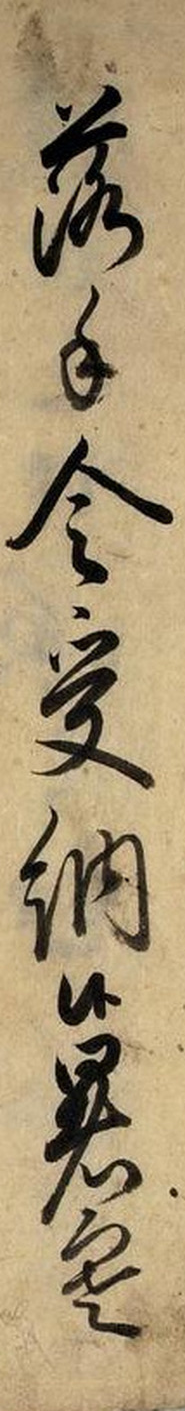落手令受納候暑寒
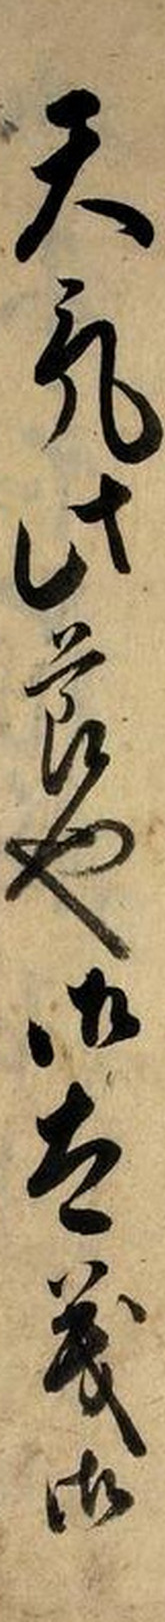天気此節也御太義御
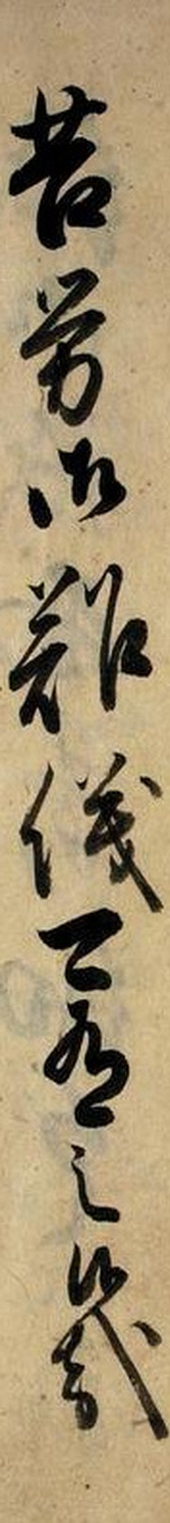苦労御難儀可有之候哉
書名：消息千字文（往来物、手習手本）
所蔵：福井県文書館 Fukui Prefectural Archives
